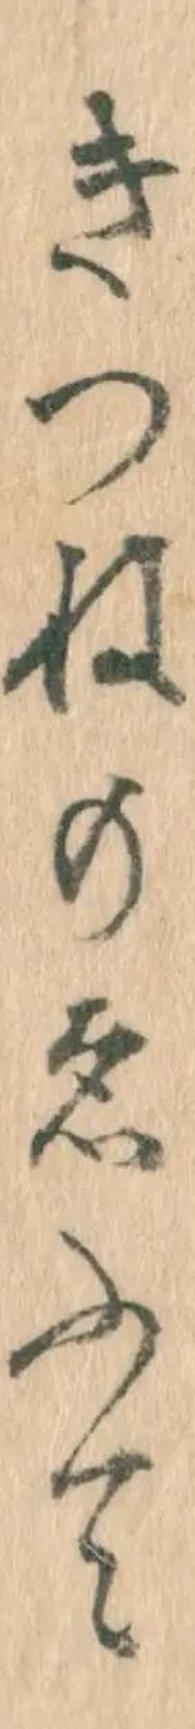きつねのゑふて
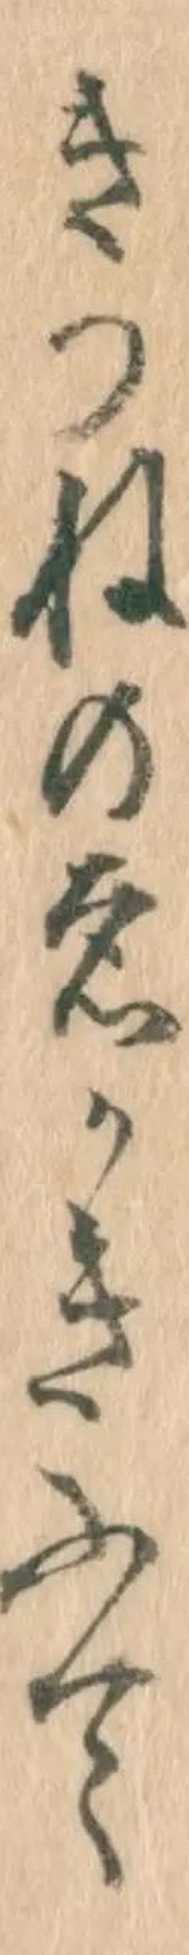きつねのゑかきふて
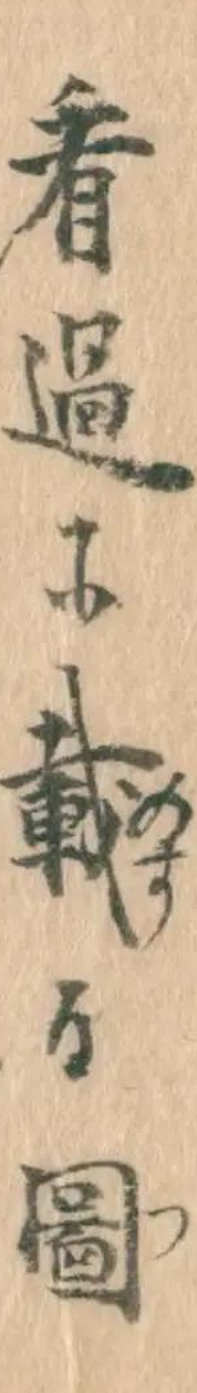看過に載る図
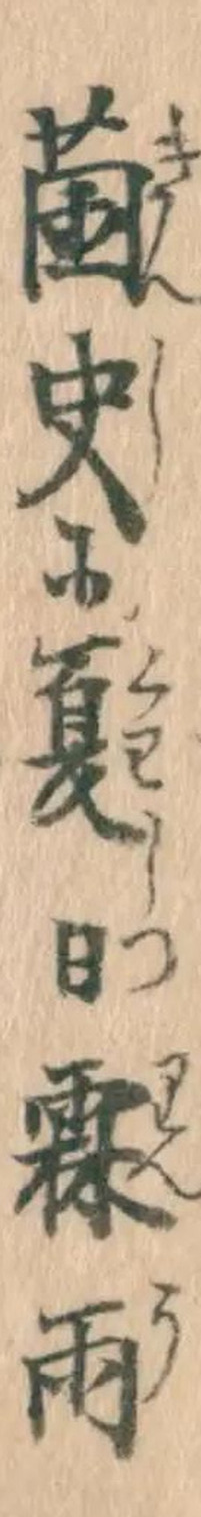菌史に夏日霖雨
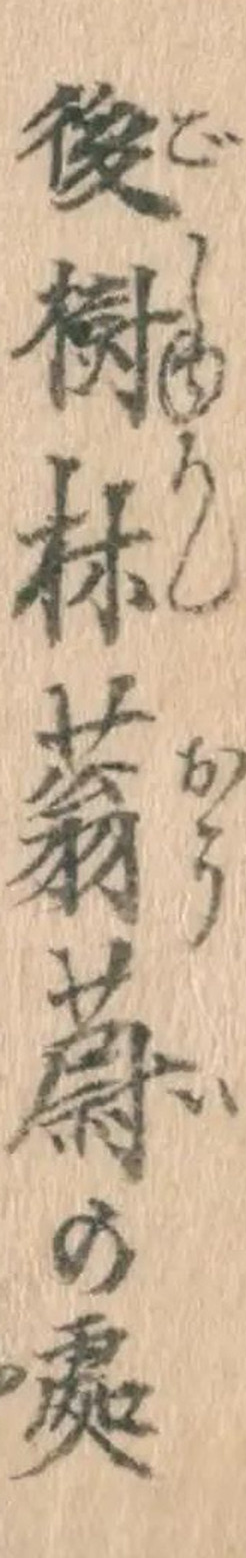後樹林蓊蔚の処
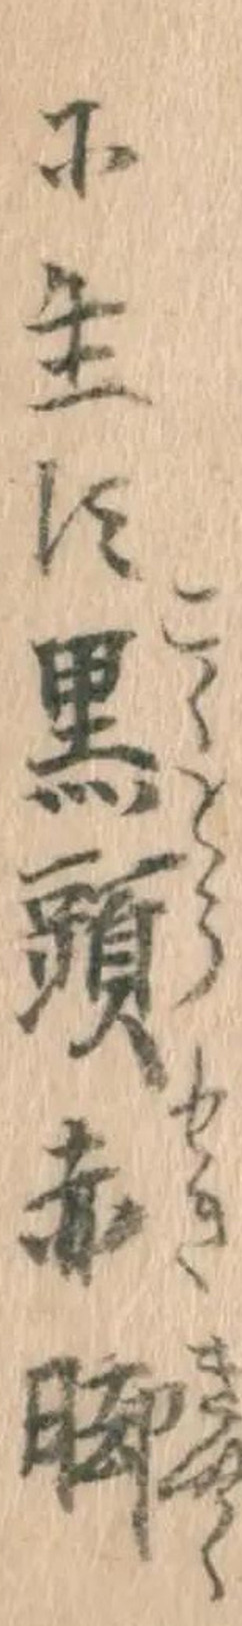に生す黒頭赤脚
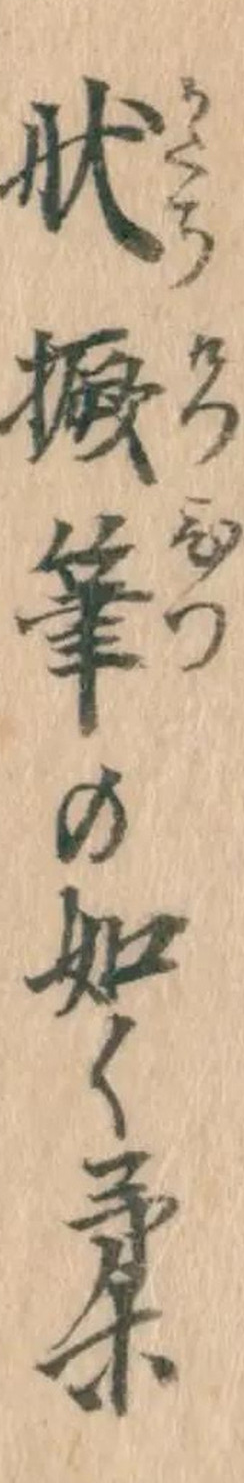状撅筆の如く柔
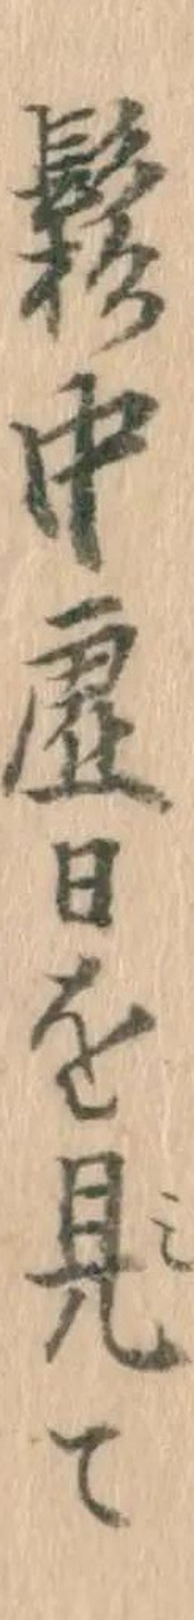鬆中虚日を見て
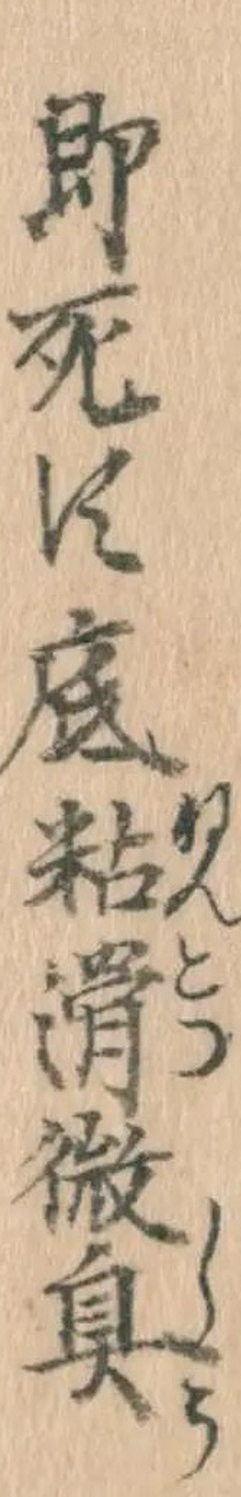即死す底粘滑微臭
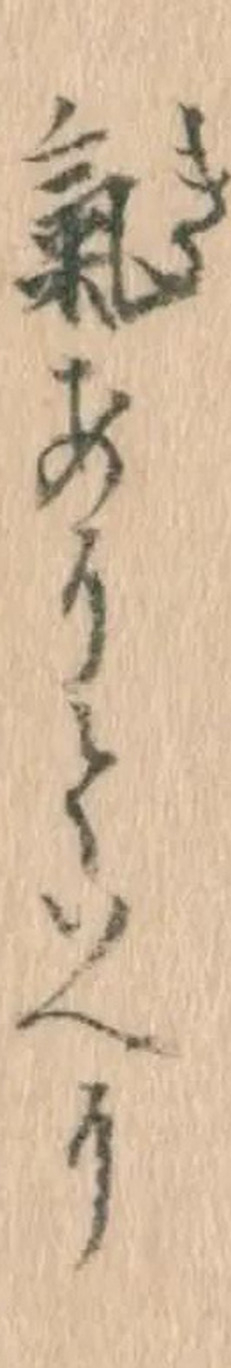気ありといへり
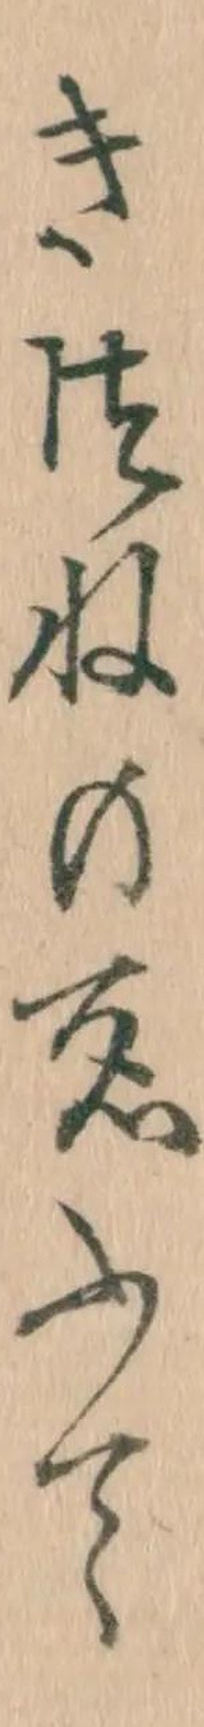きつねのゑふて
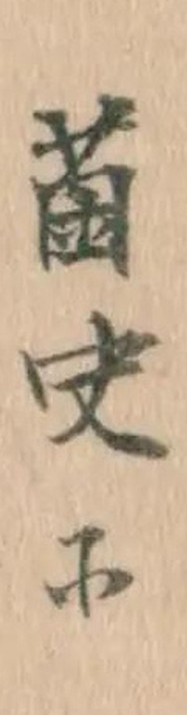菌史に
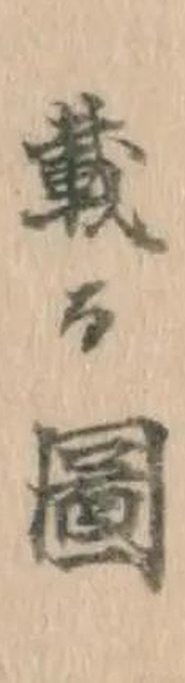載る図

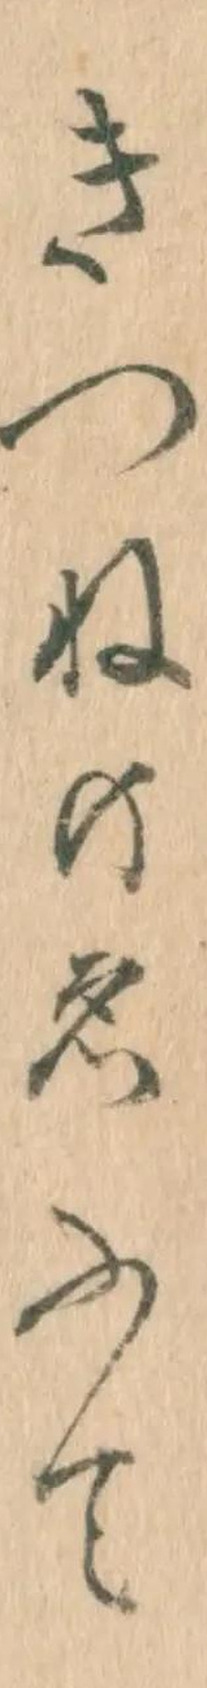きつねのゑふて
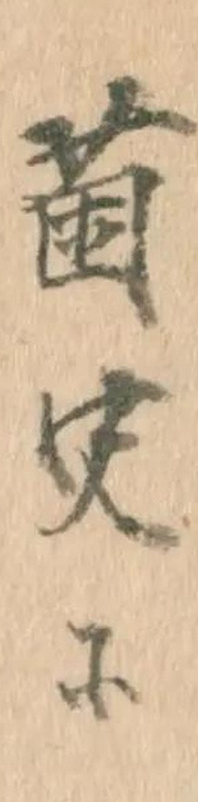菌史に
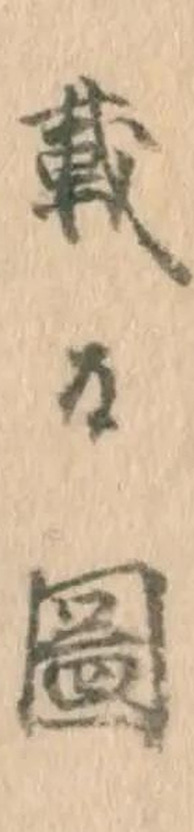載る図
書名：本草図譜. 巻58-60
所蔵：国立国会図書館 National Diet Library, JAPAN
